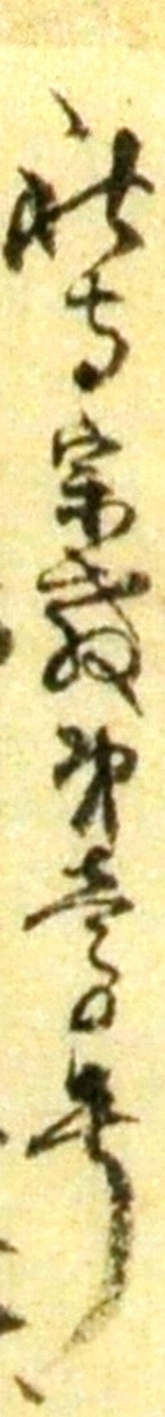社寺宗教第壱○号
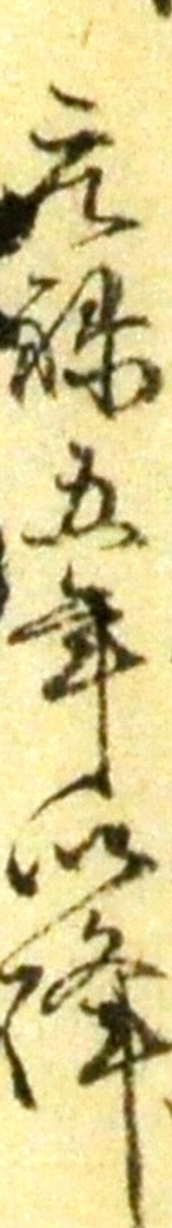元禄五年以降
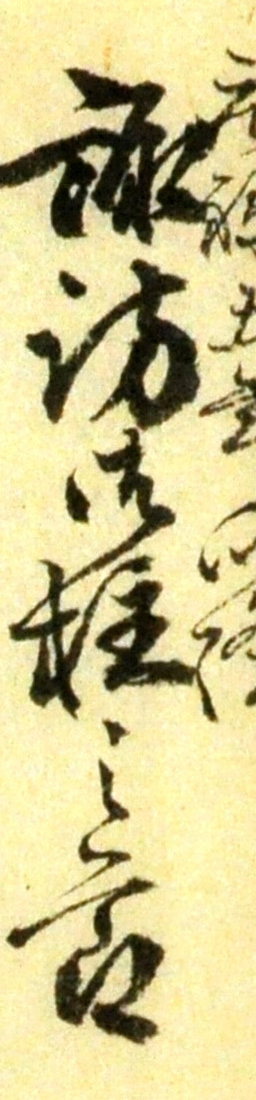諏訪御柱之節
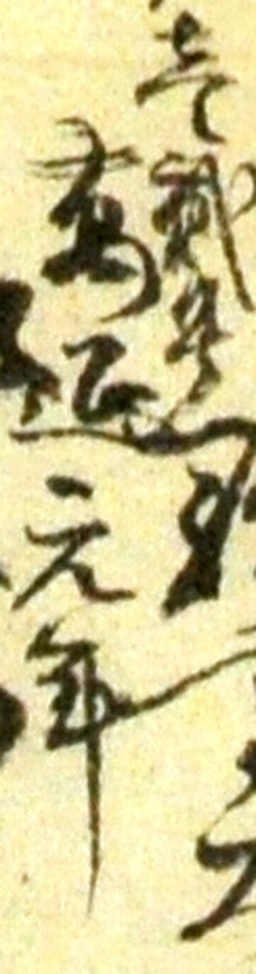万延元年
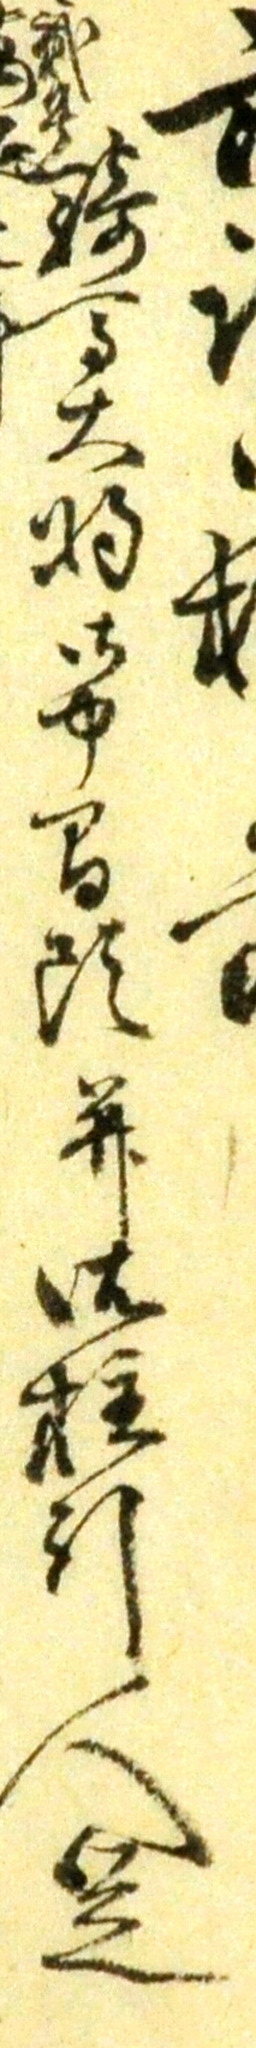騎馬大将御中間頭并御柱引人足
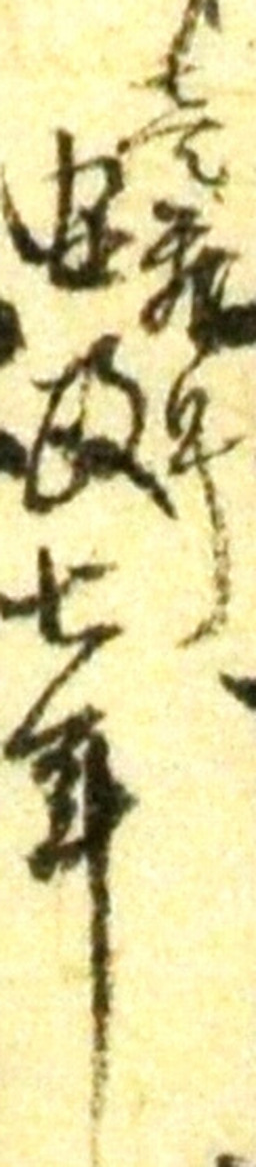安政七年
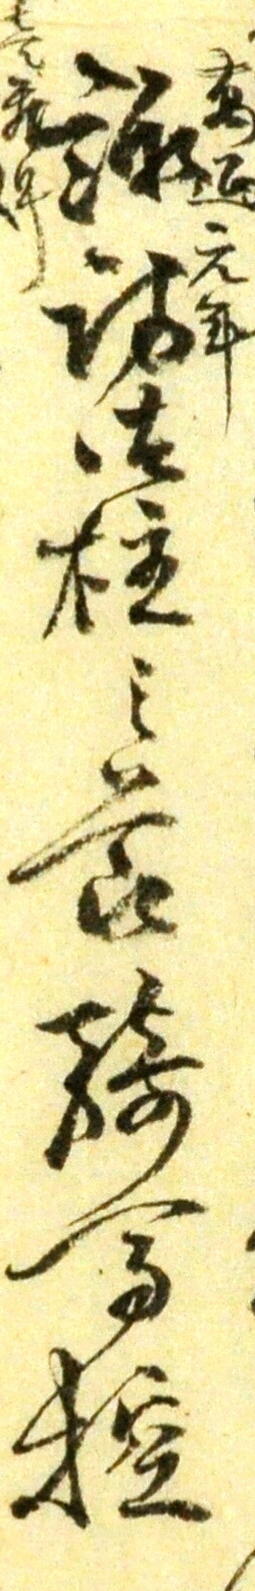諏訪御柱之節騎馬控
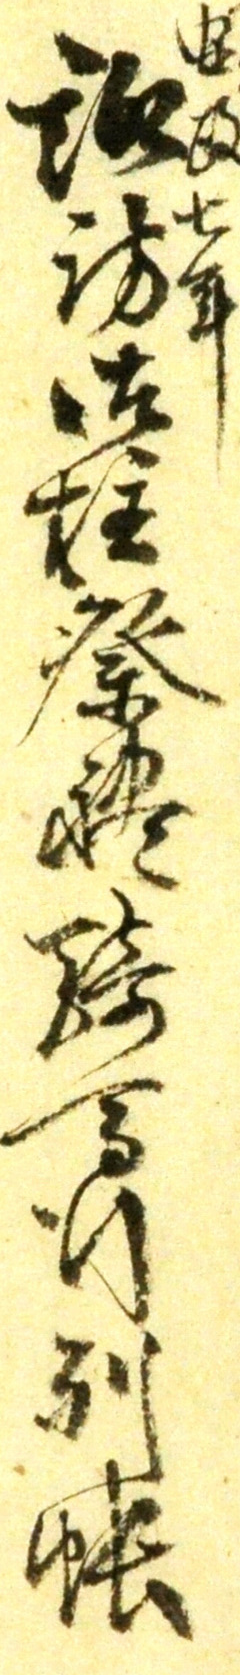諏訪御柱祭礼騎馬行列帳

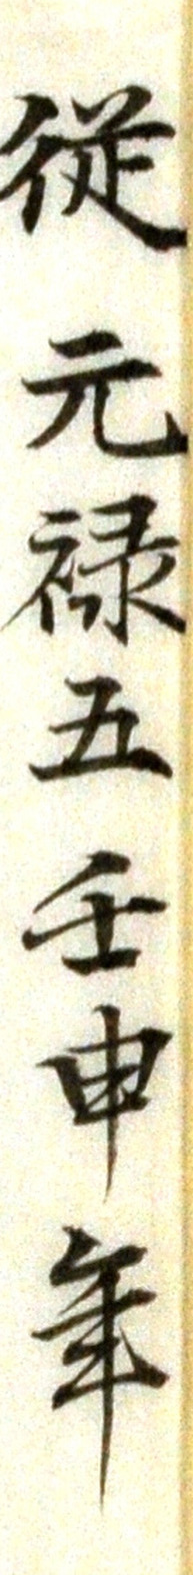元禄五壬申年
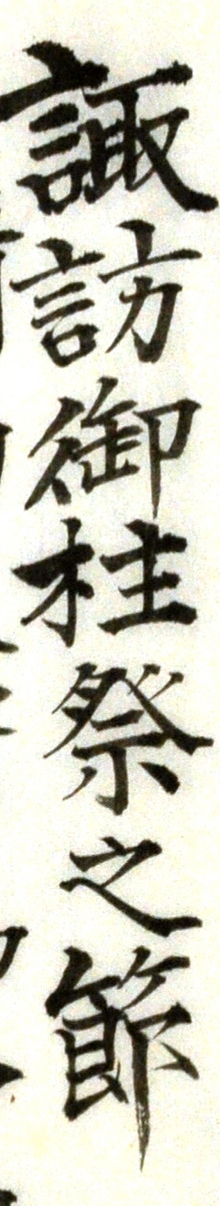諏訪御柱之節
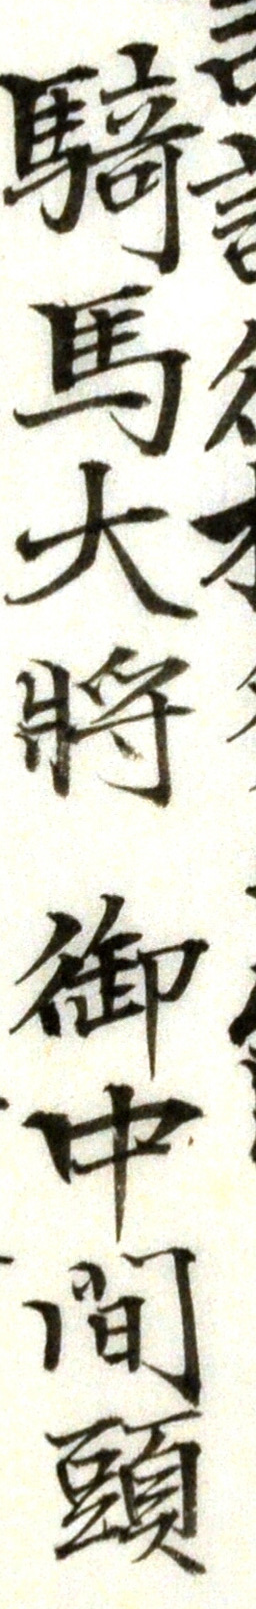騎馬大将御中間頭
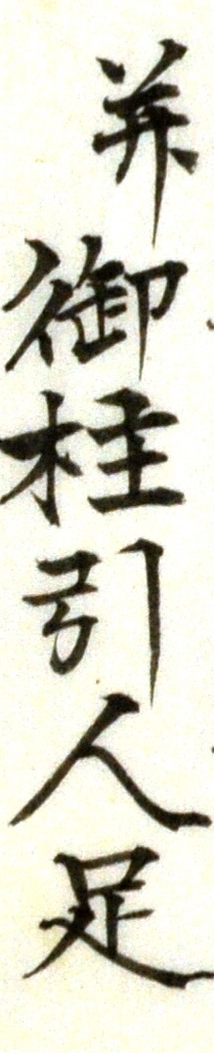并御柱引人足

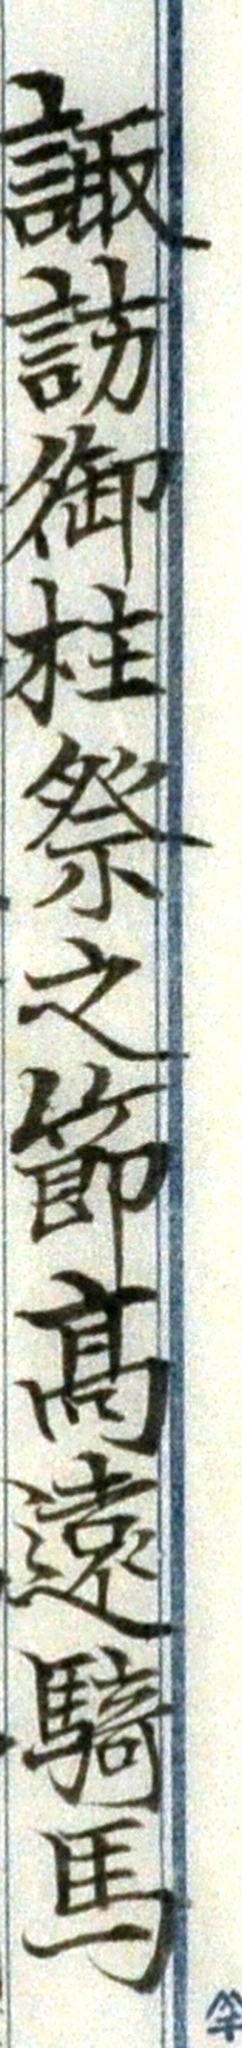諏訪御柱之節高遠騎馬
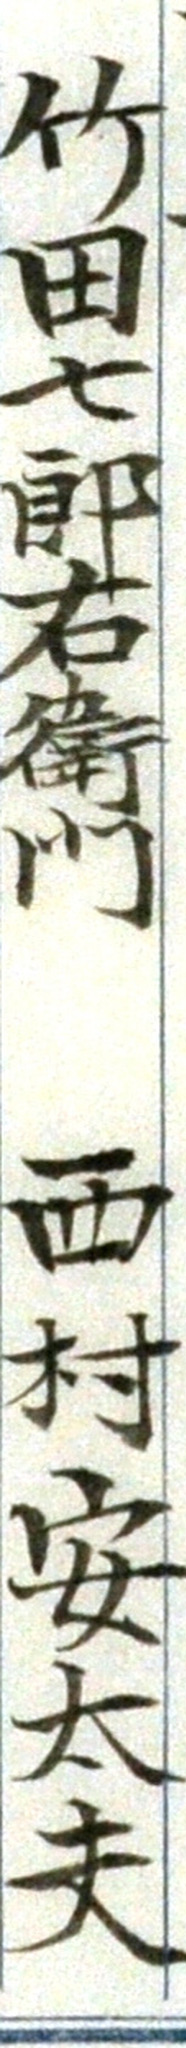竹田七郎右衛門西村安太郎
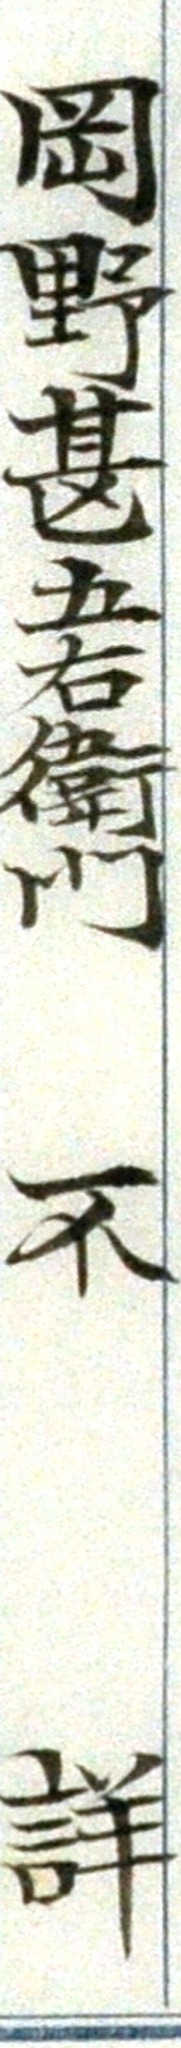岡野甚五右衛門不詳
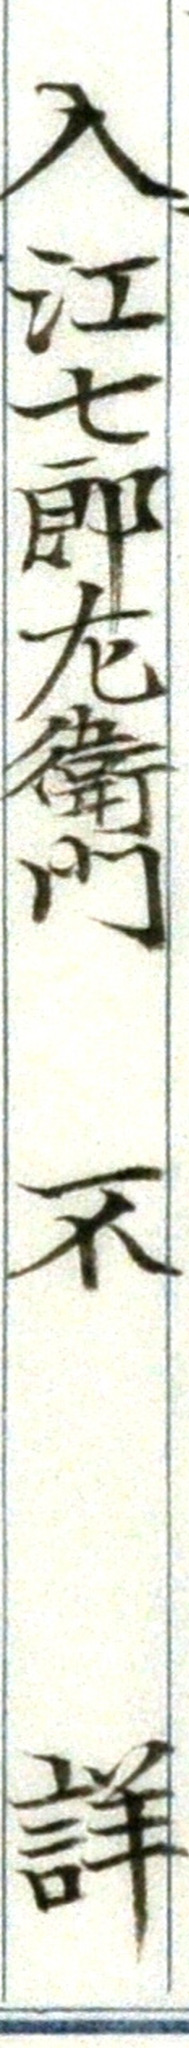入江七郎左衛門不詳
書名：諏訪御柱祭之節・騎馬大将御中間頭・御柱引人足
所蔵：伊那市立高遠町図書館・合同会社AMANE
